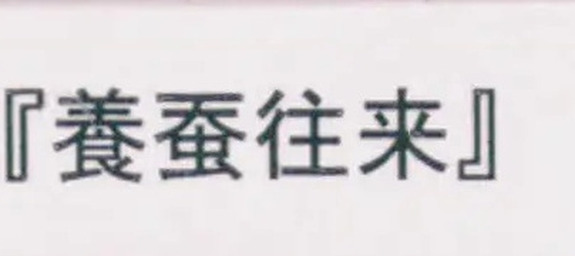養蚕往来全
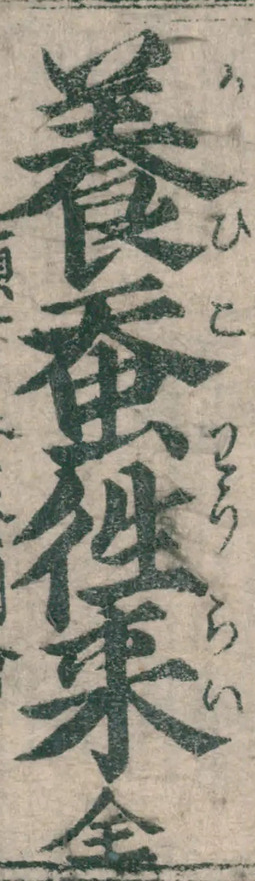養蚕往来全
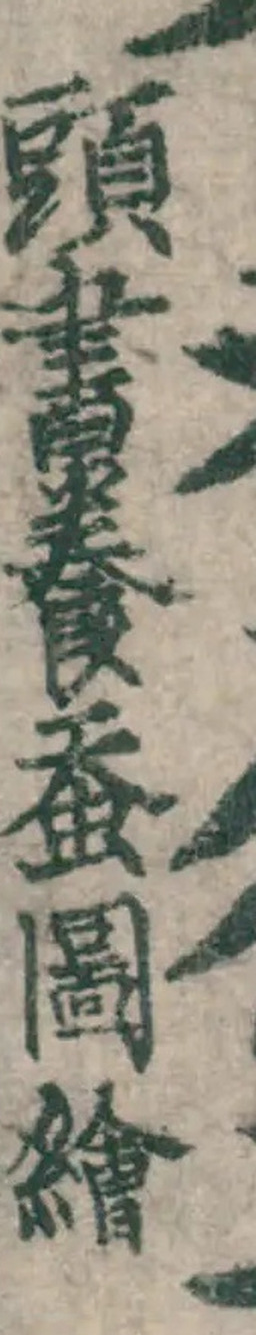頭書養蚕図絵

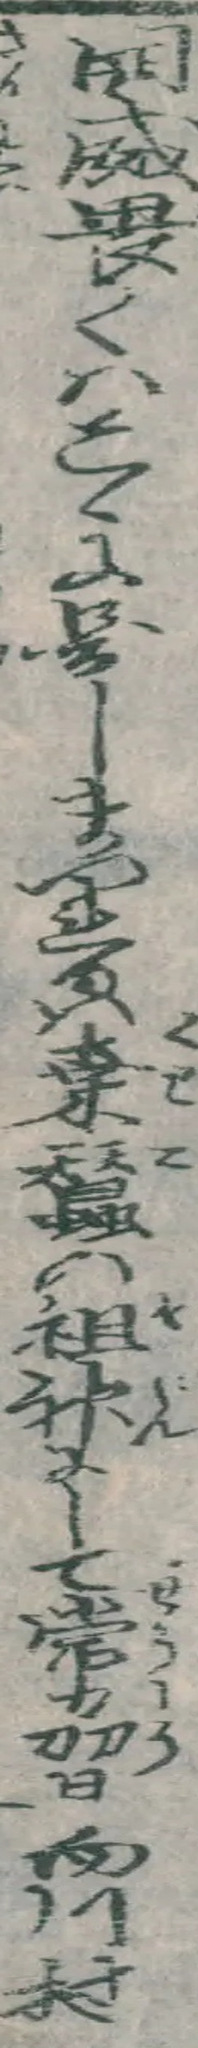開威畏くはここに図しまつれるは桑蚕の祖神にして常州日向川村
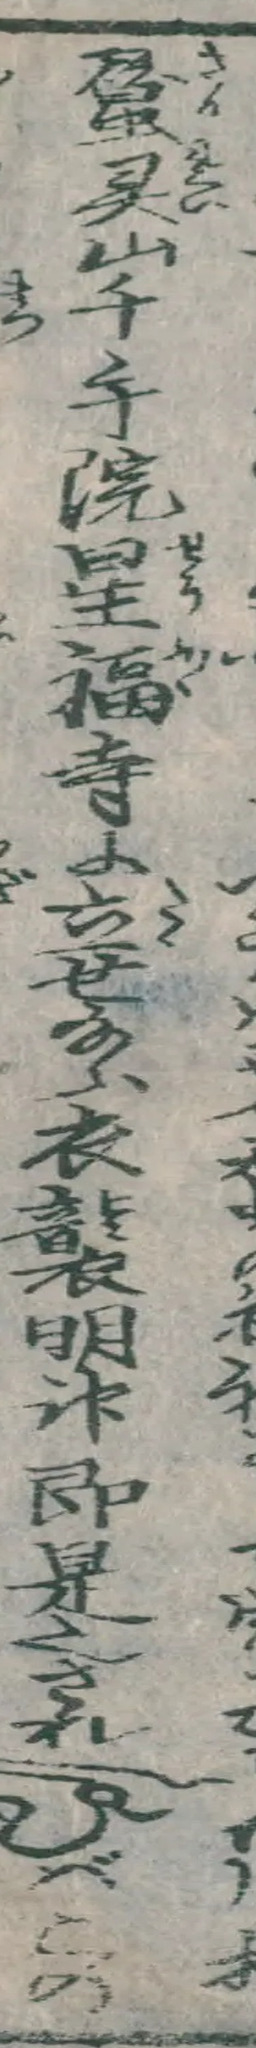蚕霊山千手院星福寺に立せ給ふ衣襲明神即是也さればこの
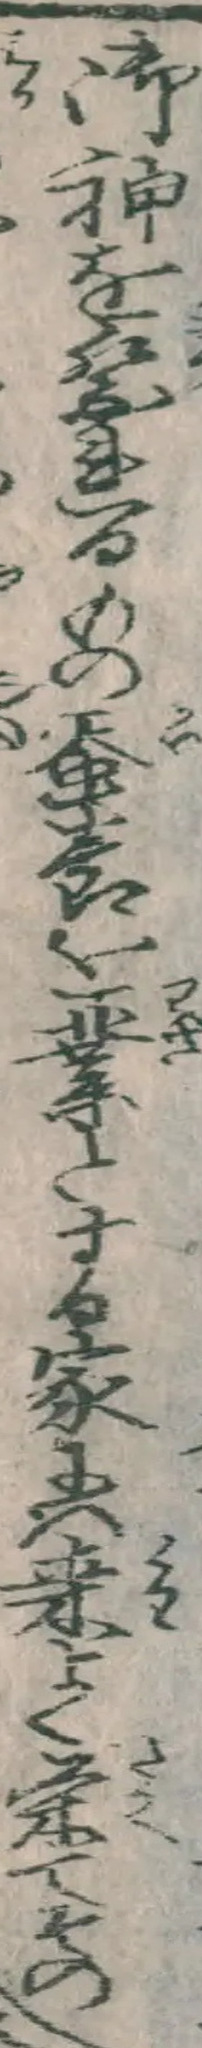御神を祭れるもの蚕養を業とする家には桑よく栄てその若葉の
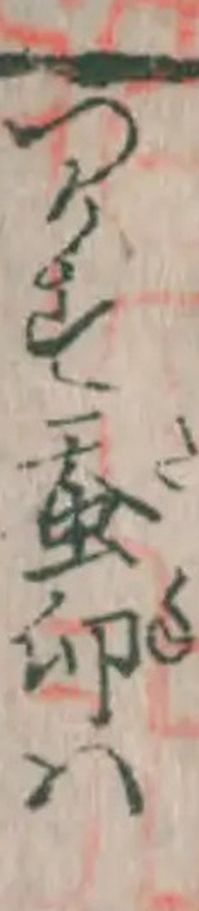つかず蚕卵は
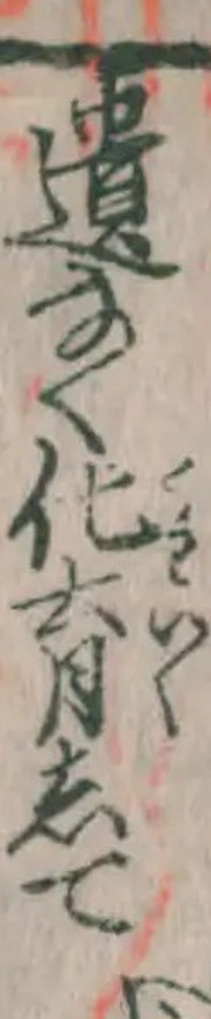遺なく化育して
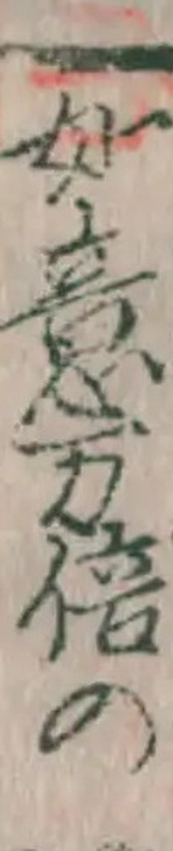如意万倍の
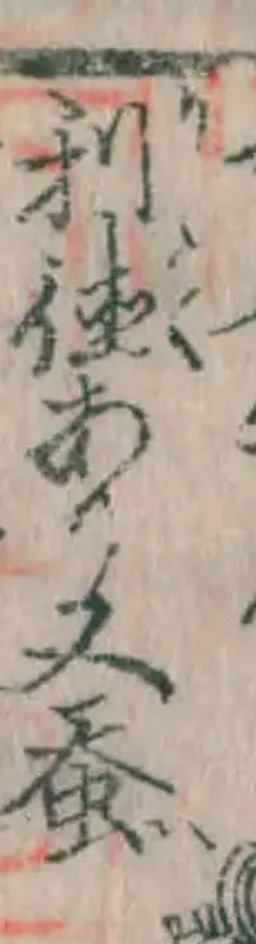利徳あり又蚕
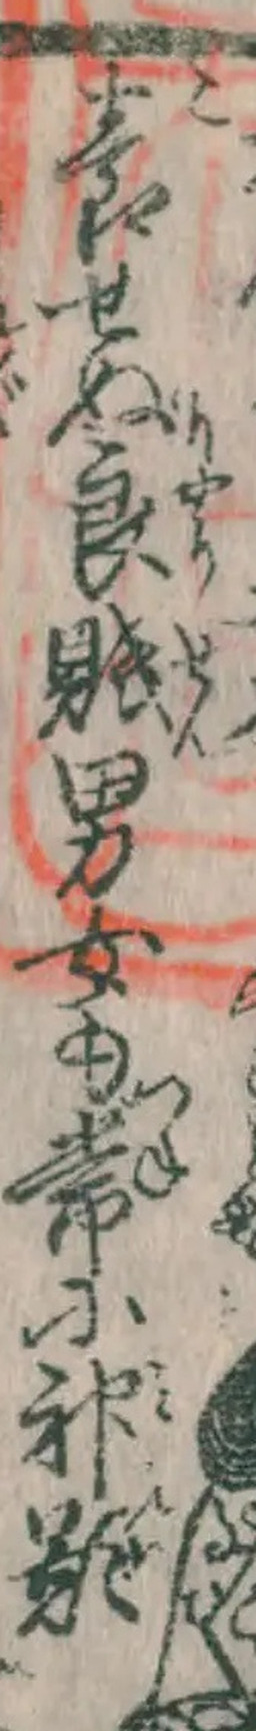養せぬ良賤男女も常に神影
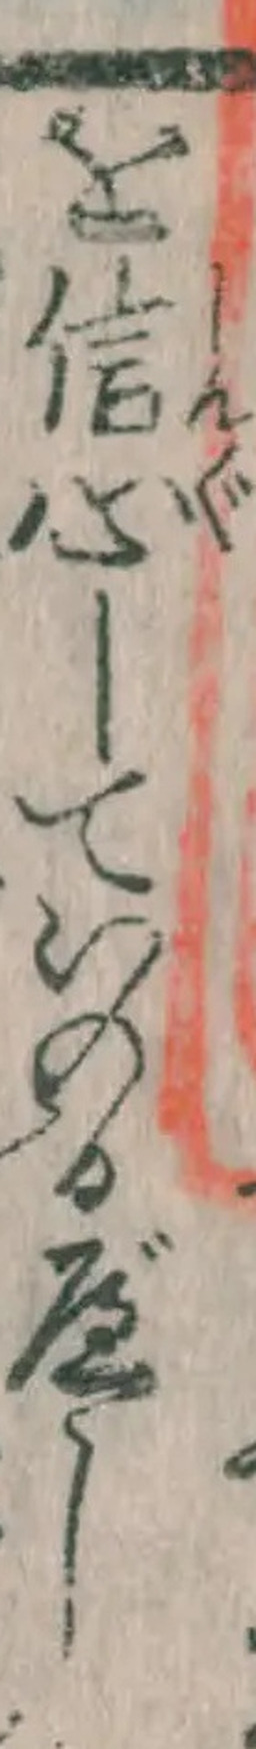を信心していのるべし
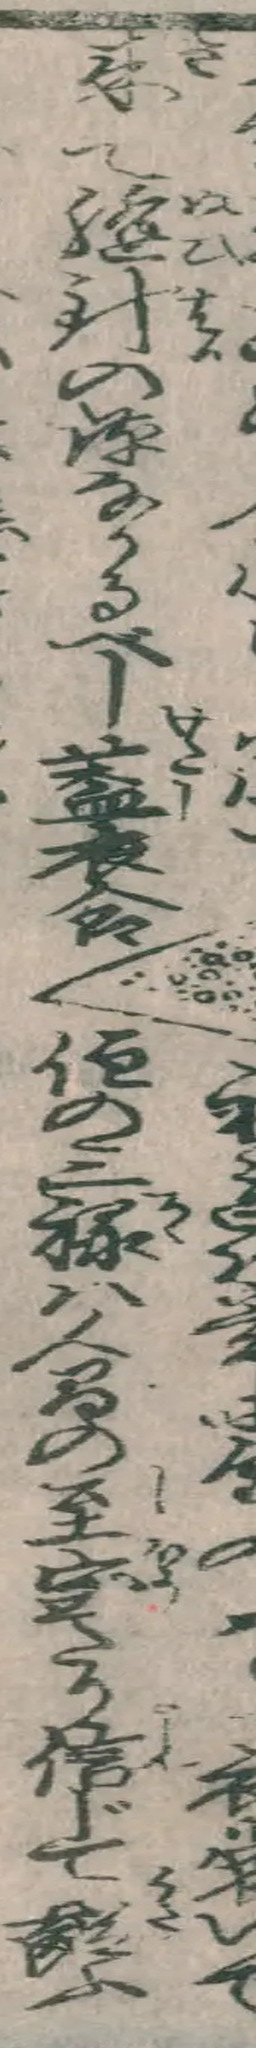来て縫針の隙なかるべし蓋衣食住の三禄は人間の至宝たり信じて疑ふ
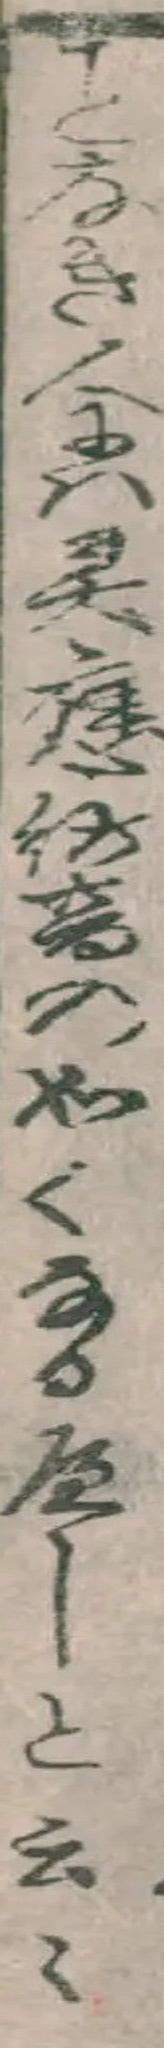ことなき人には霊応紡の如くなるへしと云々
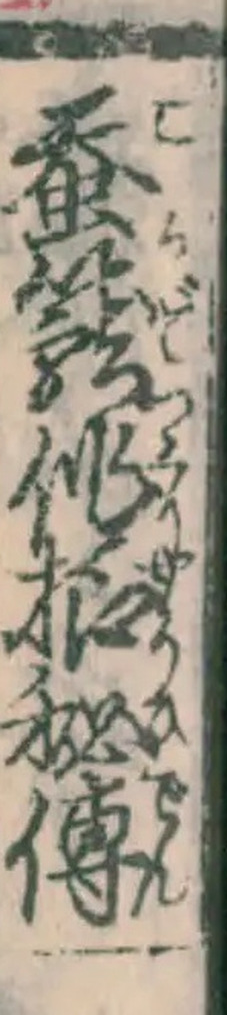蚕籠作様秘伝
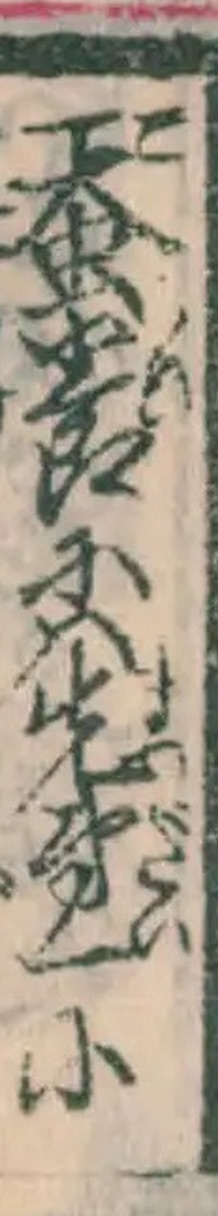蚕養には先第一に
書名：養蚕往来
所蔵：国立国会図書館 National Diet Library, JAPAN
